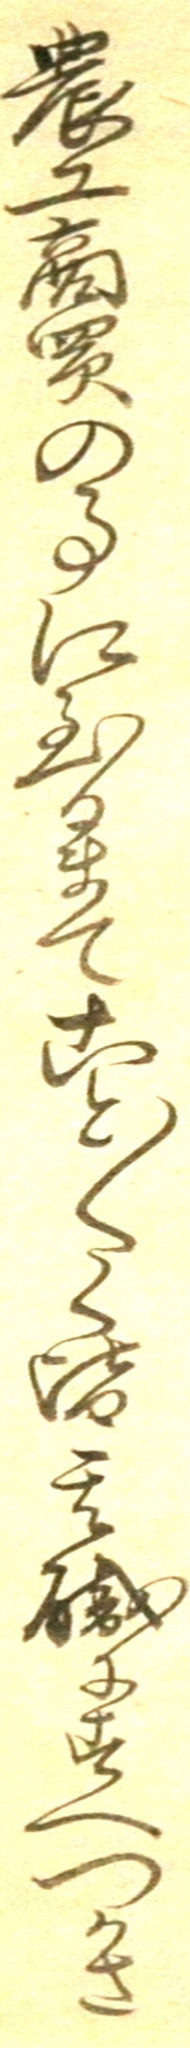農工商買の事に至るまてこと〳〵く皆その職にすへつかさ
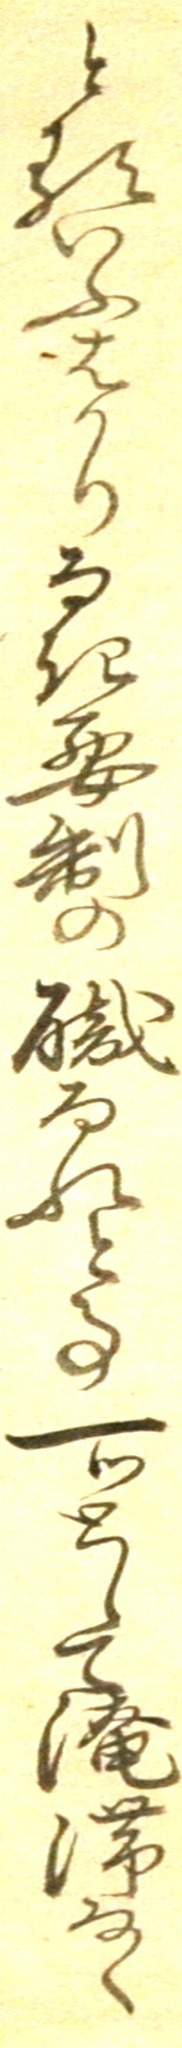とるいふはかりなき要制の職なれと事一ッとして淹滞なく
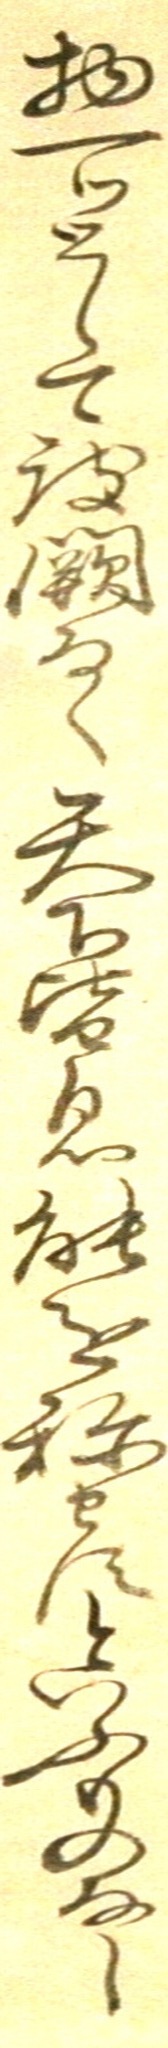物一ッとして致闕なく天下皆息能を称せすといふものなし

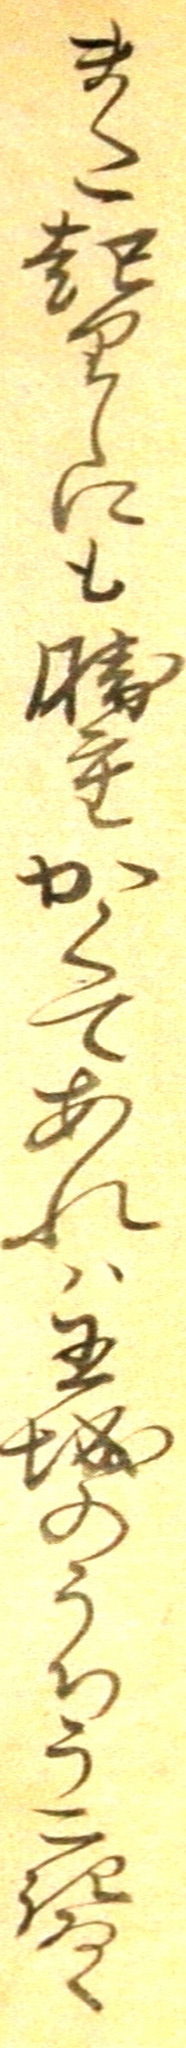また起りしにも勝重かくてあれは王城のうちうこきなく
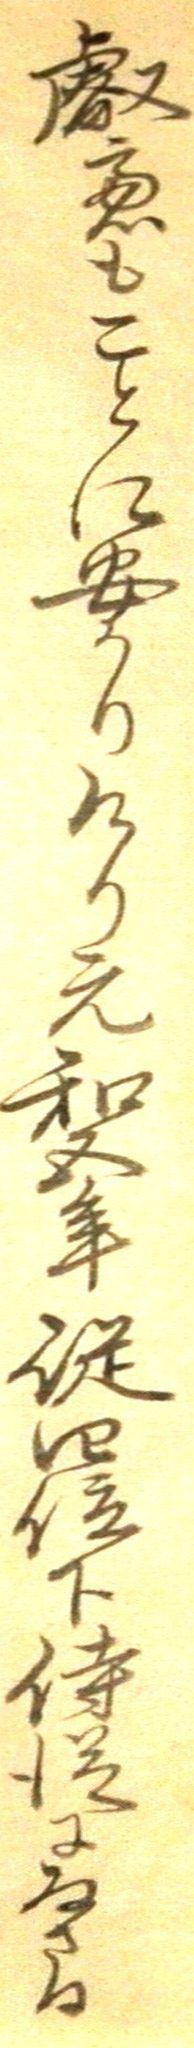叡慮もことに安かりけり元和五年従四位下侍従になさる
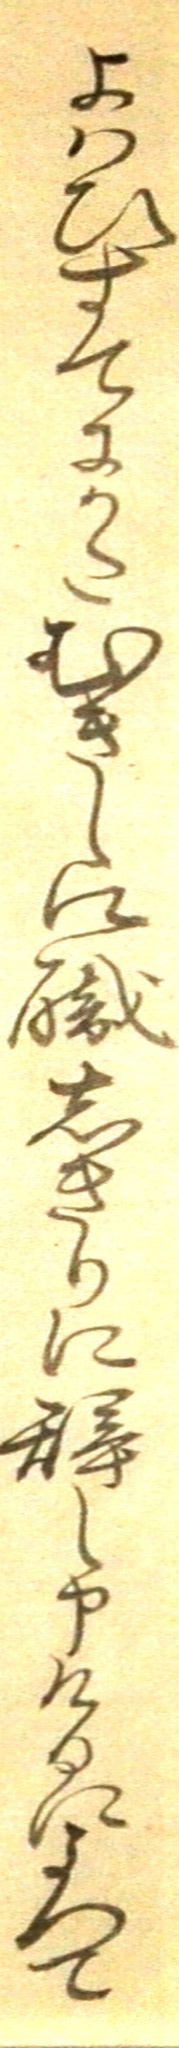よはひすてにかたむきしに職しきりに辞し申けるによつて
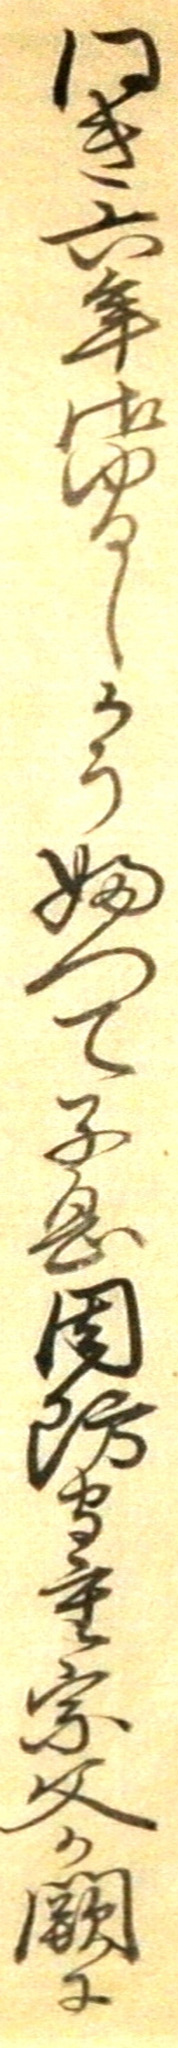同き六年御ゆるしかうふつて子息周防守重宗父か闕に
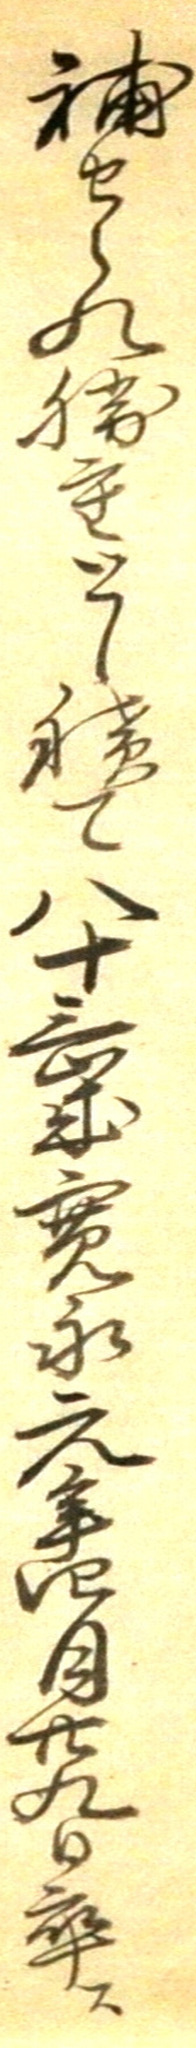補せられ勝重とし積て八十三歳寛永元年四月廿九日卒ス
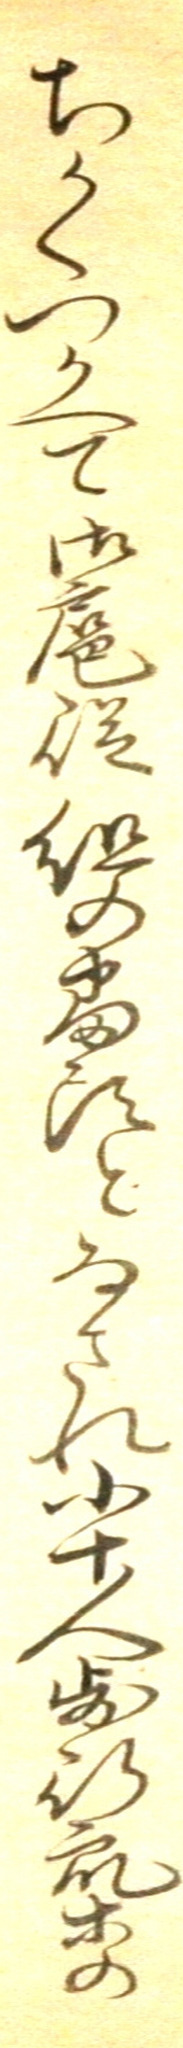ちかくつかへて御扈従組の番頭となされ小十人歩行衆等の
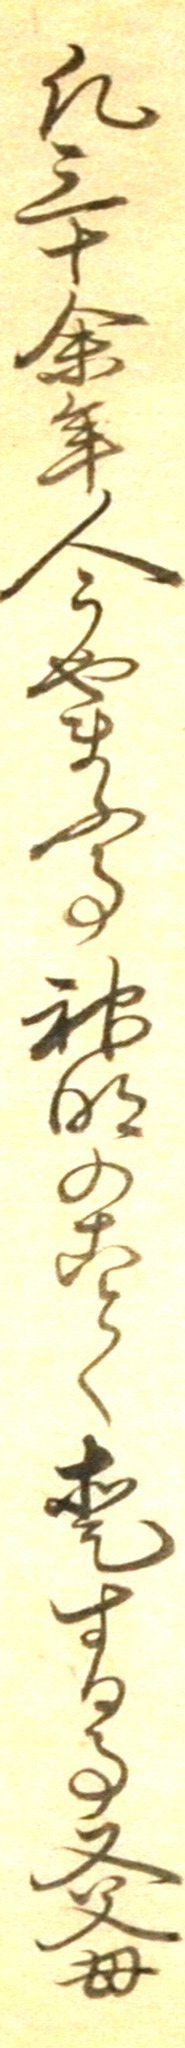凡三十余年人うやまふ事神明のことく愛する事又父母
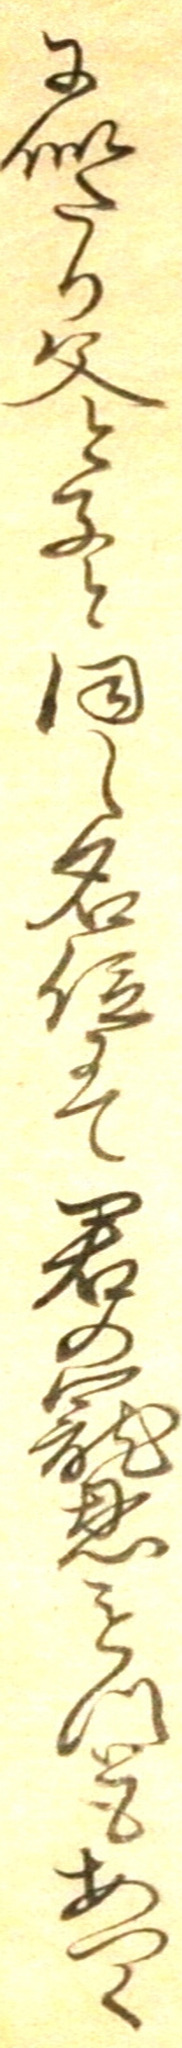に似たり父と子と同し名位にて君の寵恩もつともあつく
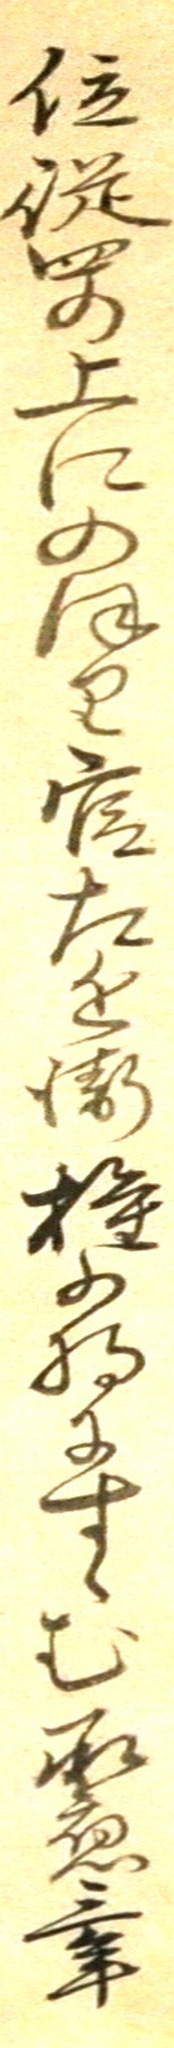位従四の上にのほり官左近衛権少将にすゝむ承応三年
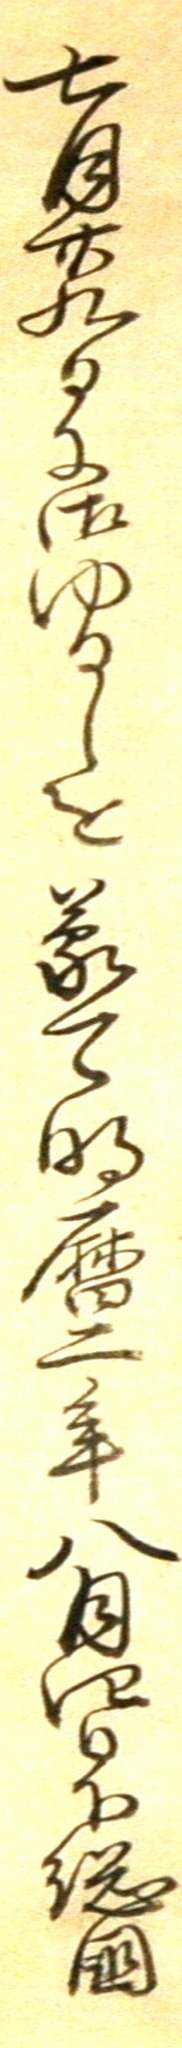七月廿九日に御ゆるしを蒙て明暦二年八月四日下総国

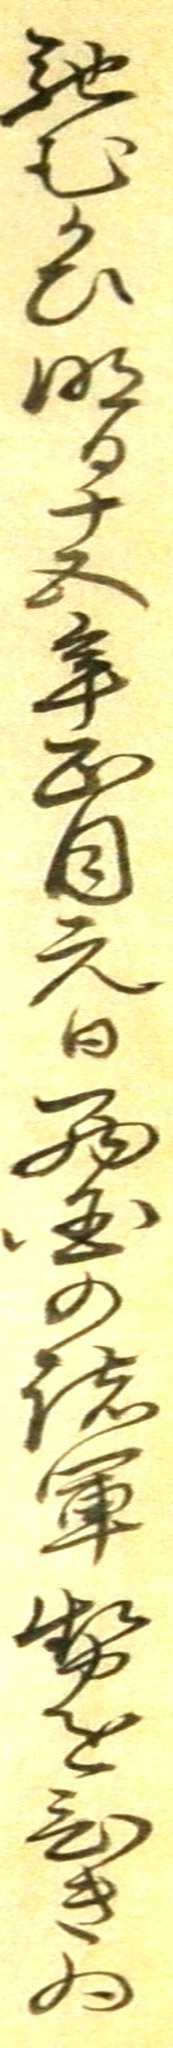馳むかひ明る十五年正月元日西国の諸軍勢をひきゐ
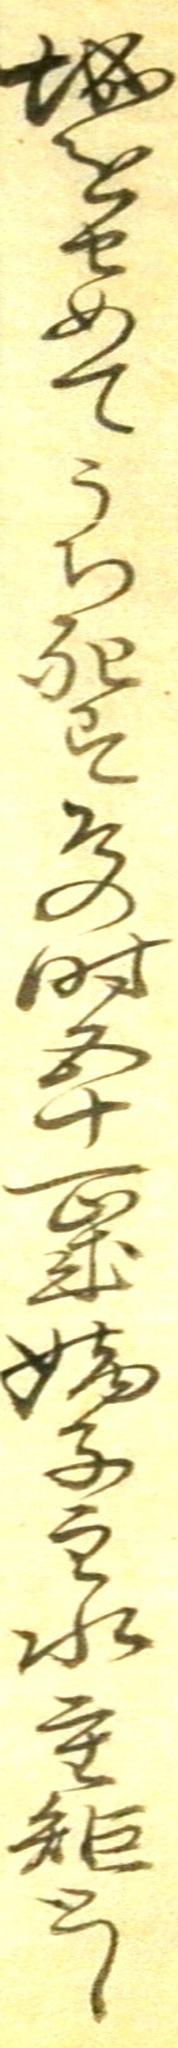城をせめてうち死すその時五十一歳嫡子主水重矩とし
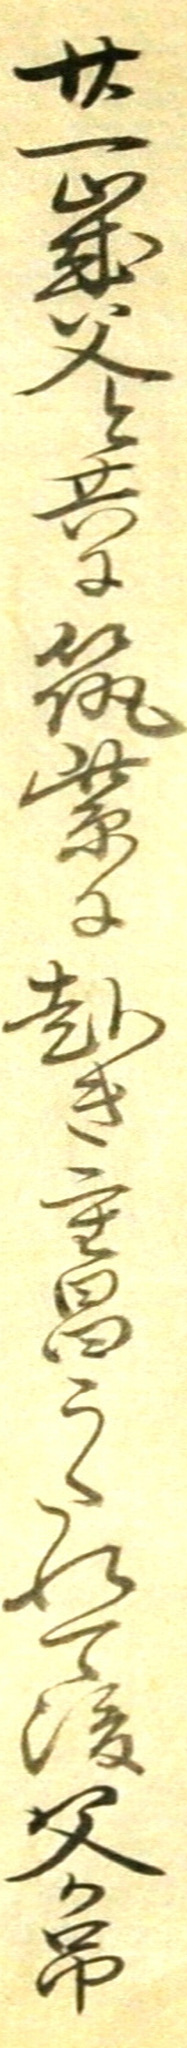廿一歳父と共に築紫に赴き重昌うたれて後父か弔
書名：藩翰譜（五）
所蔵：伊那市立高遠町図書館・合同会社AMANE
